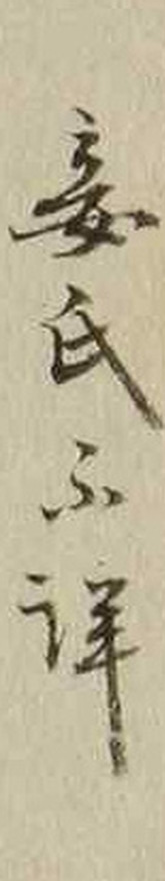妾氏不詳
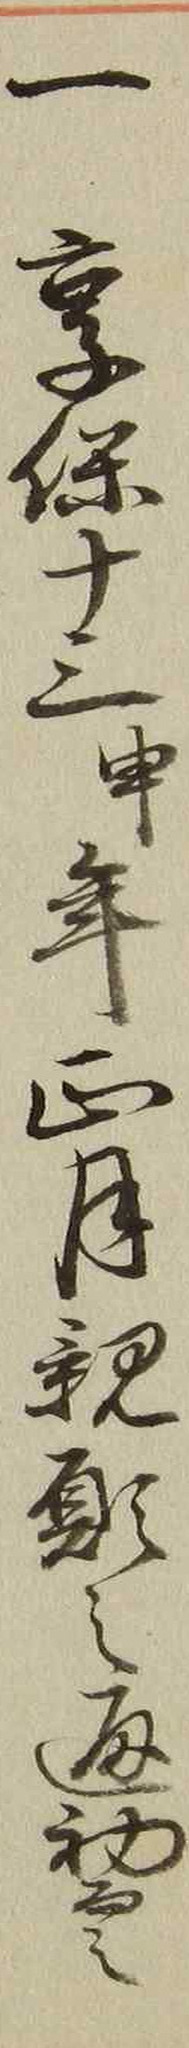一享保十三申年正月親願之通初而之
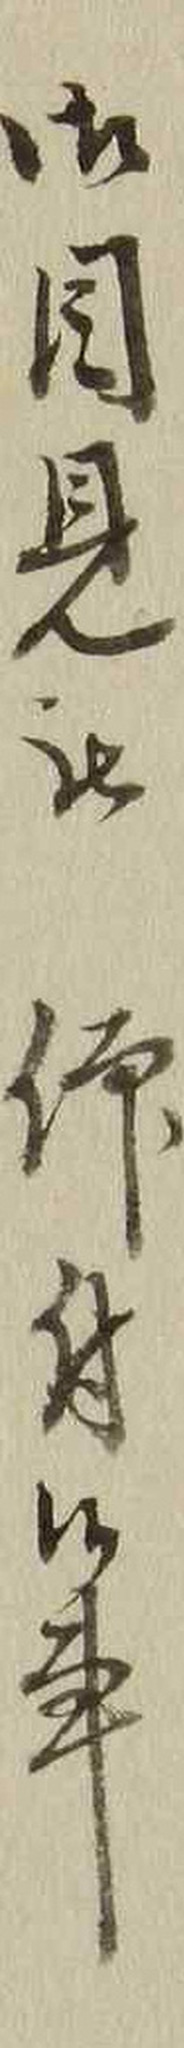御目見被仰付候事
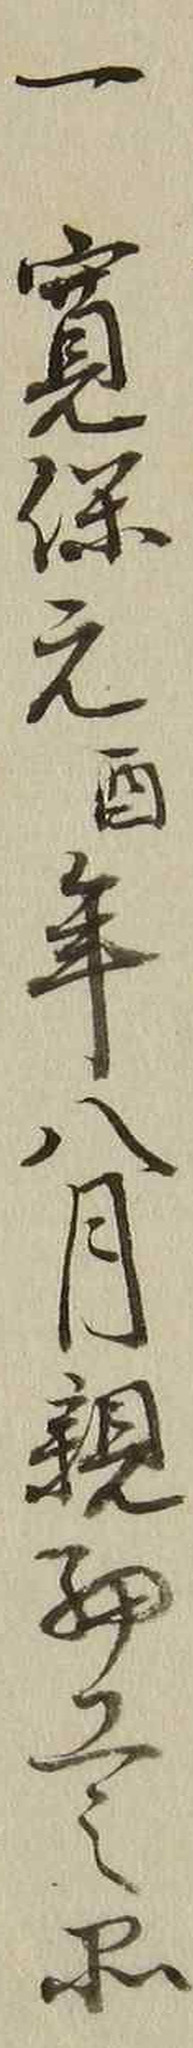一寛保元酉年八月親細工之品
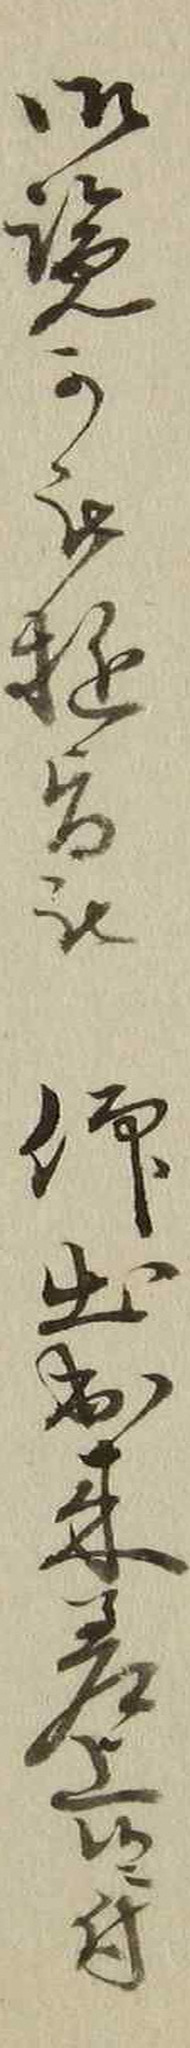御覧可被遊旨被仰出出来差上侯ニ付
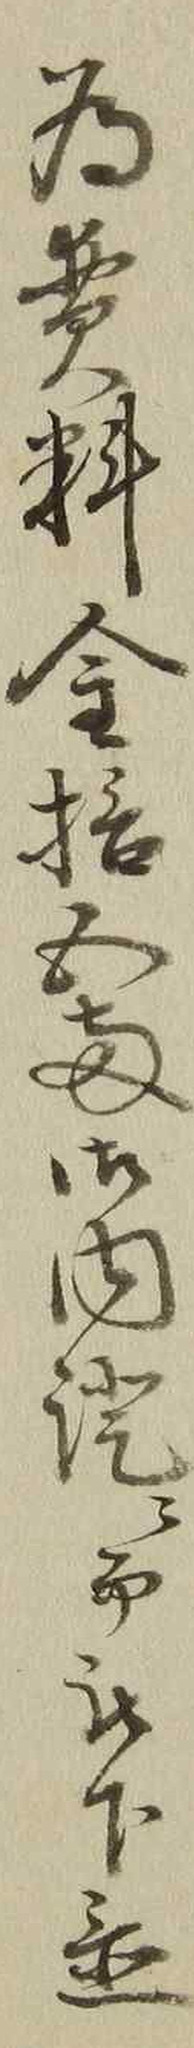為費料金拾五両御内証ニ而被下置
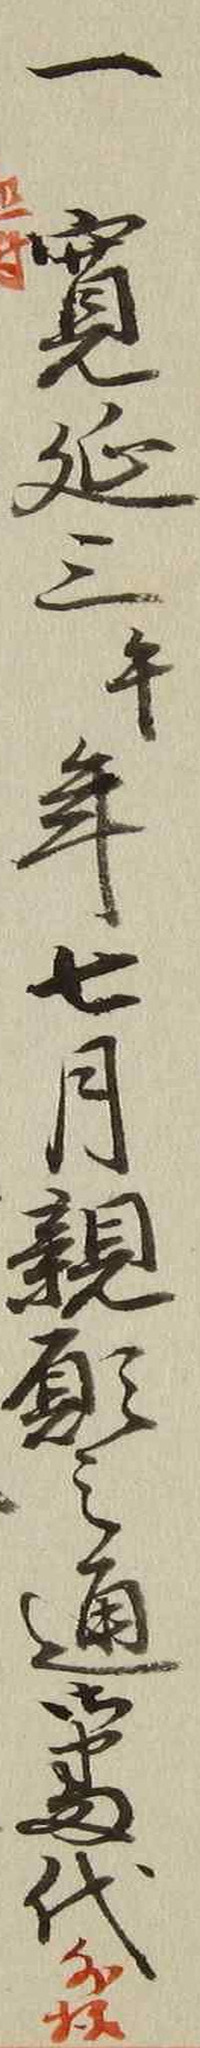一寛延三午年七月親願之通御番代外様
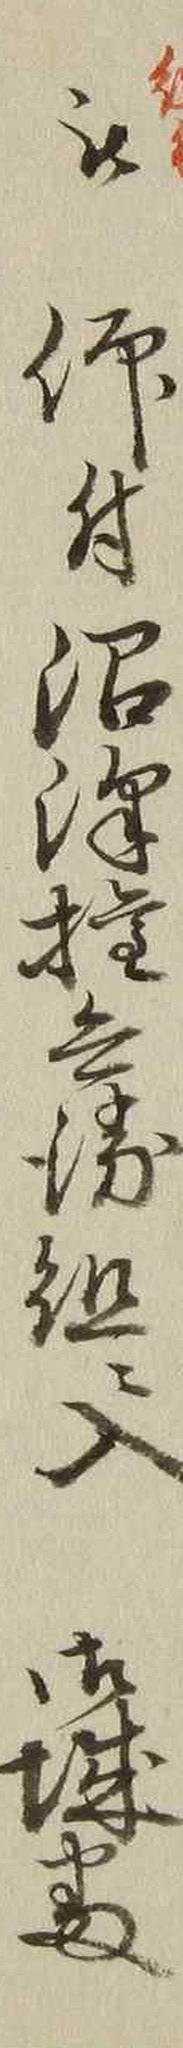組付被仰付沼沢権兵衛組ニ入御城番
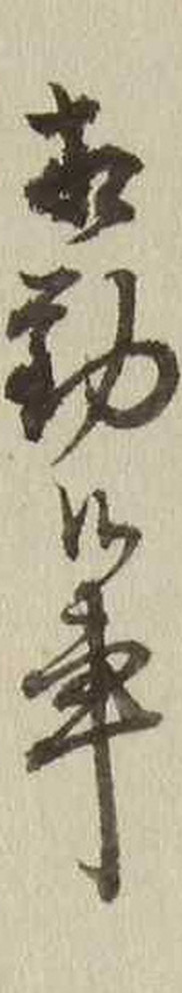相勤候事
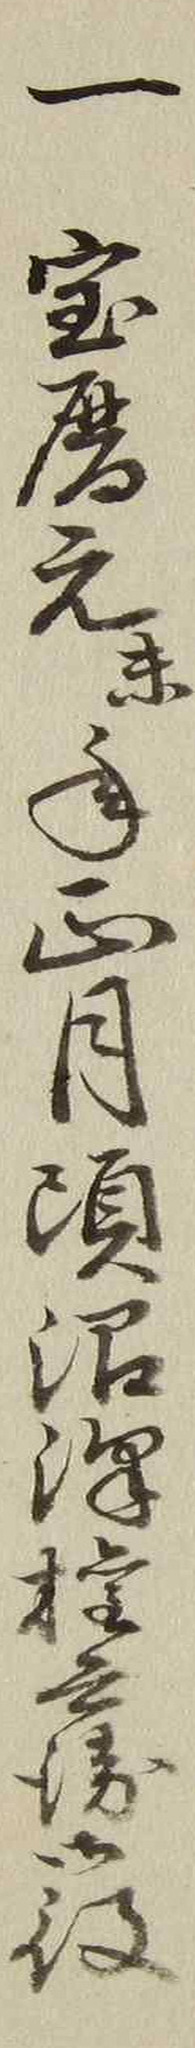一宝暦元未年正月頭沼沢権兵衛御役
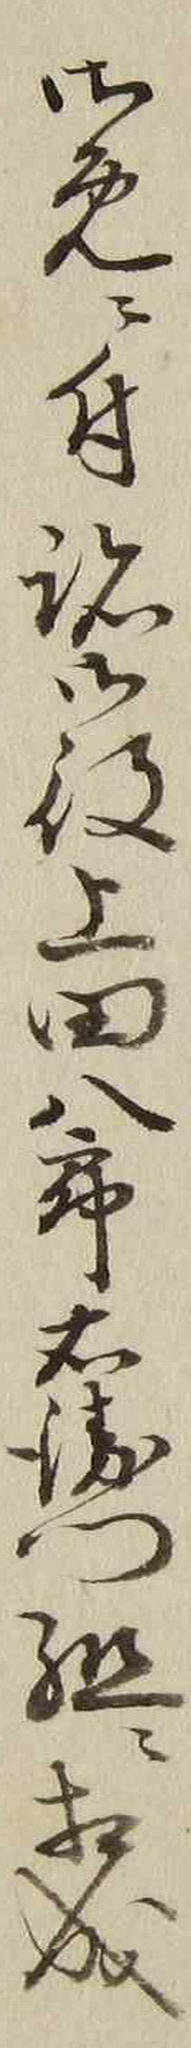御免ニ付跡御役上田八郎右衛門組ニ相成
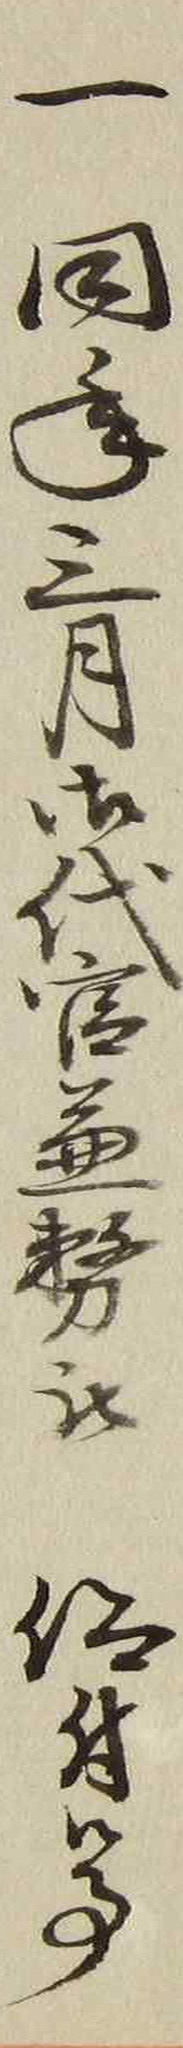一同年三月御代官兼務被仰付候事
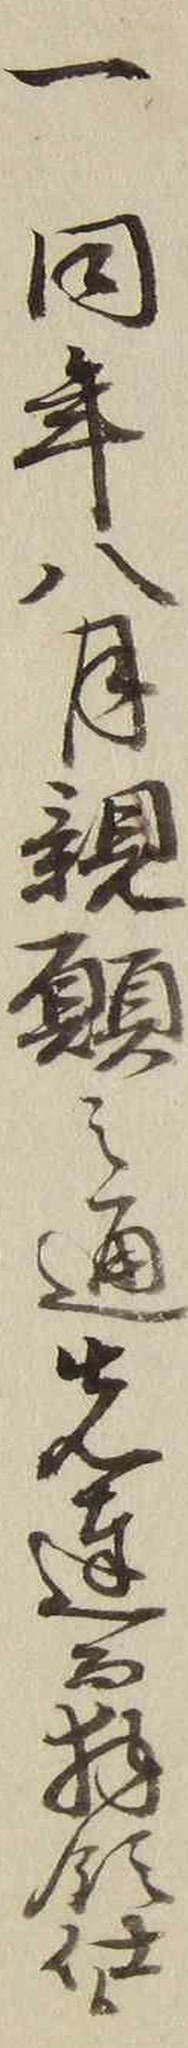一同年八月親願之通先達而拝領仕候
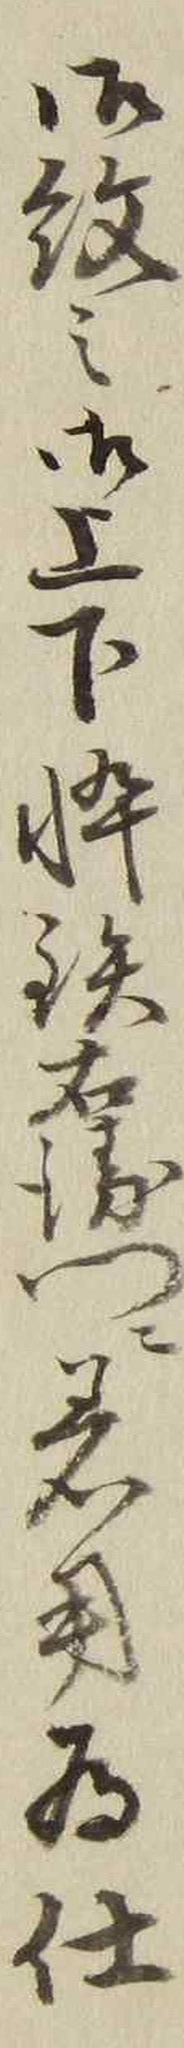御紋之御上下忰鉄右衛門ニ着用為仕

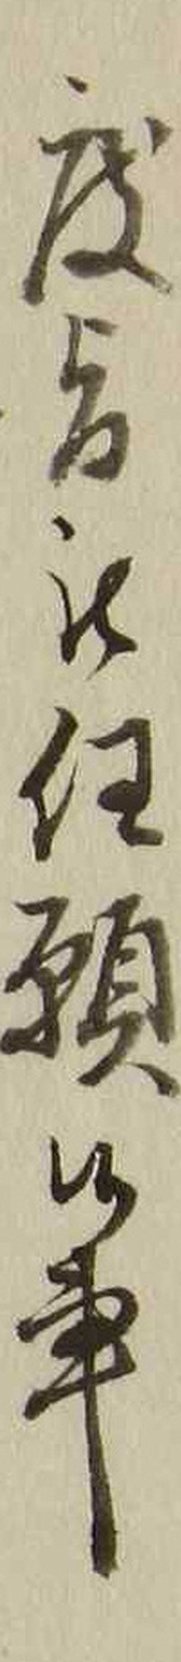度旨被任願候事
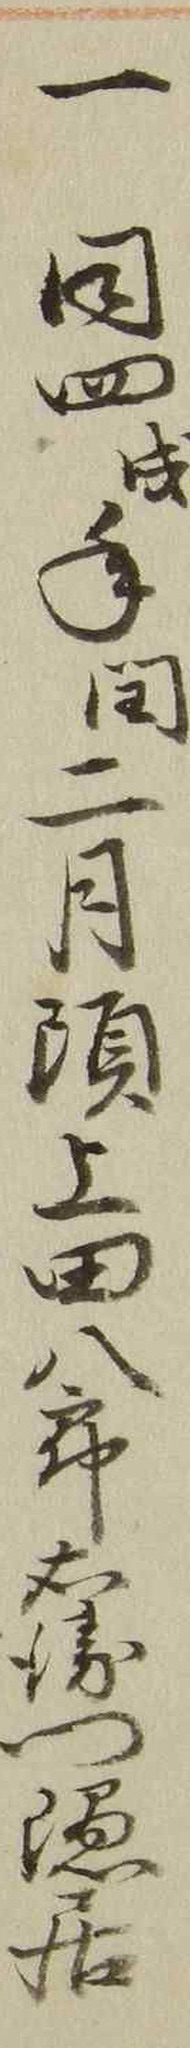一同四戌年閏二月頭上田八郎右衛門隠居
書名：諸士系譜　巻之27　い之部27
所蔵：会津若松市立会津図書館
